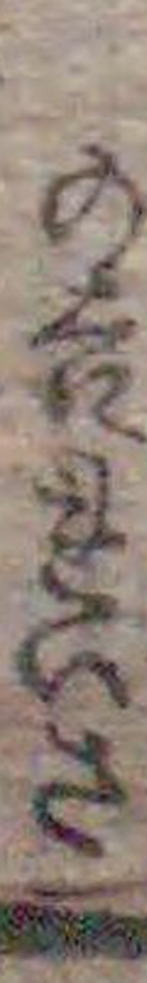の吉れいさ

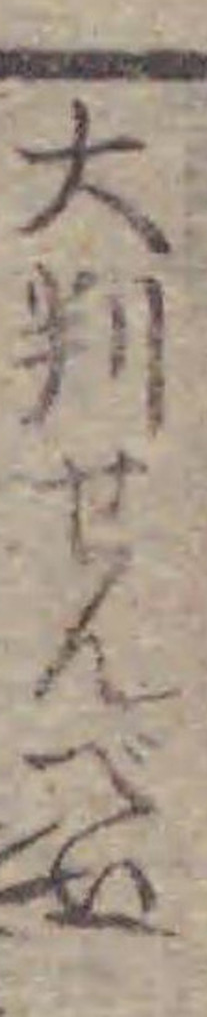大判せんべい
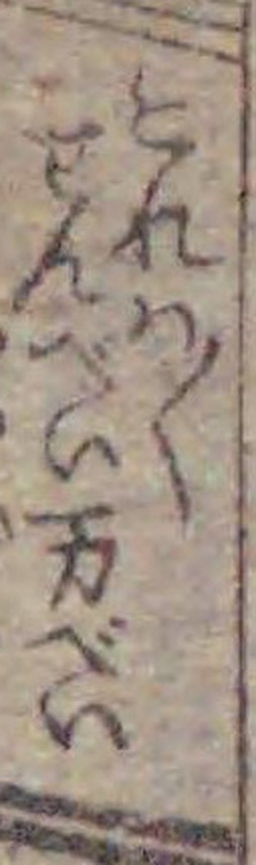せんべい万べい
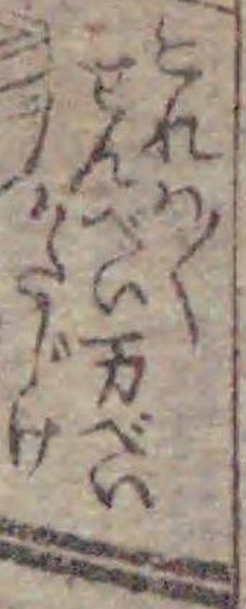せんべい万べい
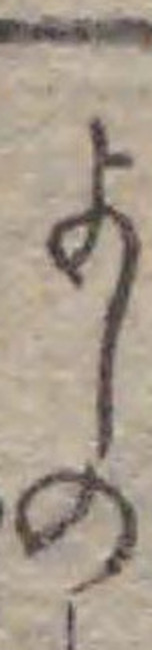よしの
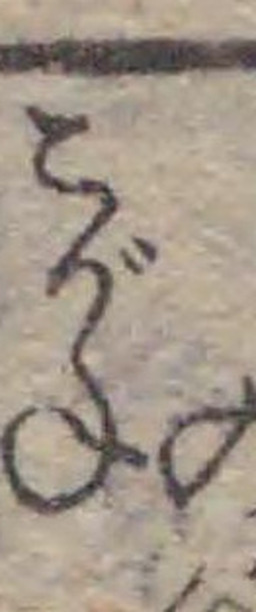こがね
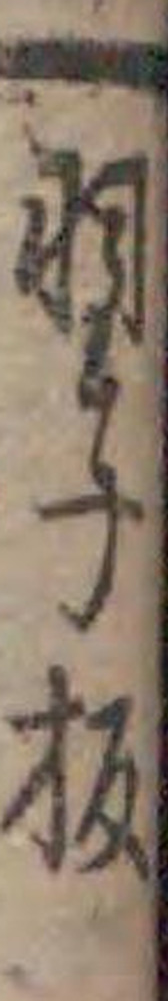羽子板
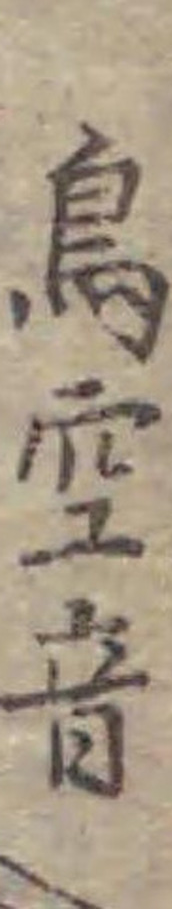鳥空音
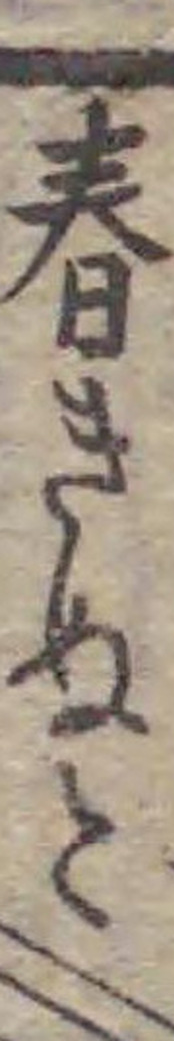春きぬと
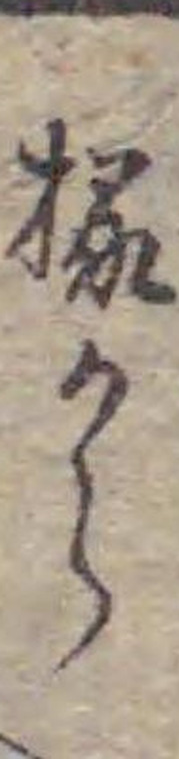椽から
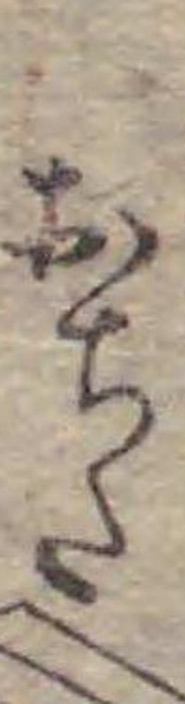おちた
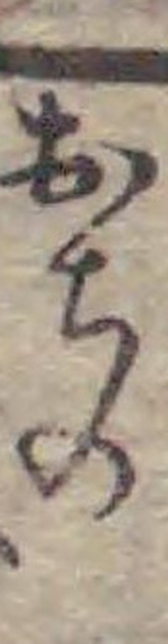おちの
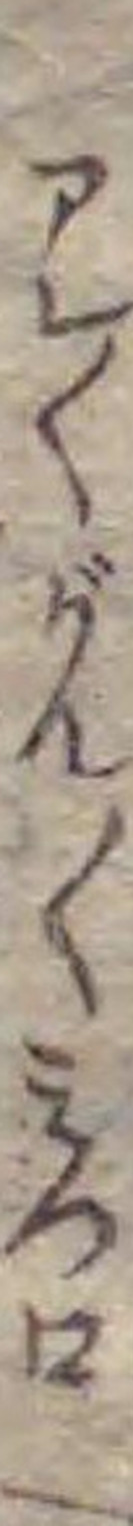アレ〳〵がん〳〵みつ口
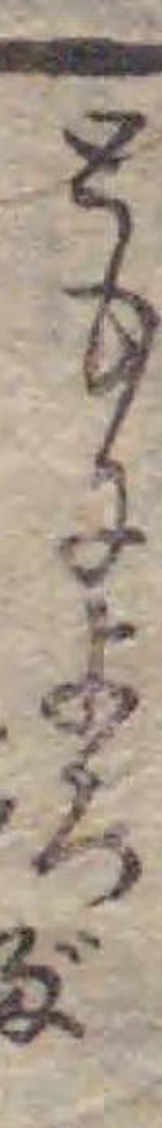ともによろ
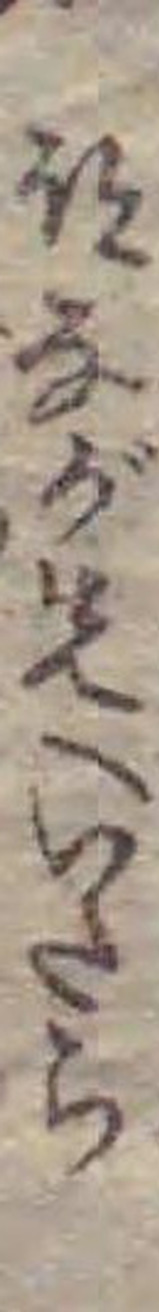跡なが先へいたら
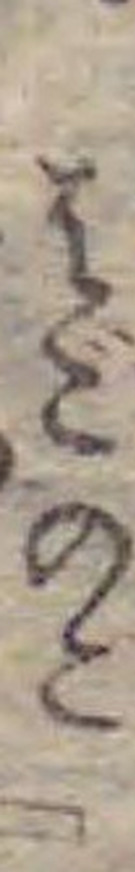はごのこ
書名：年始御礼帳 : 3巻
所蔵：国立国会図書館 National Diet Library, JAPAN
